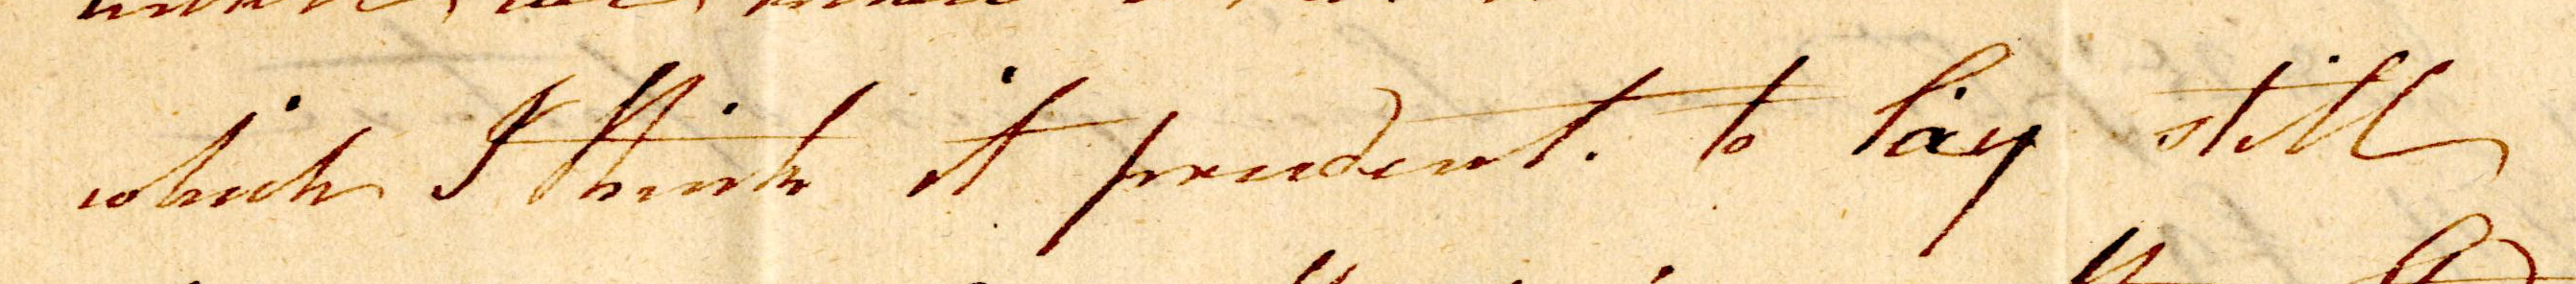which I think it prudent to lay still
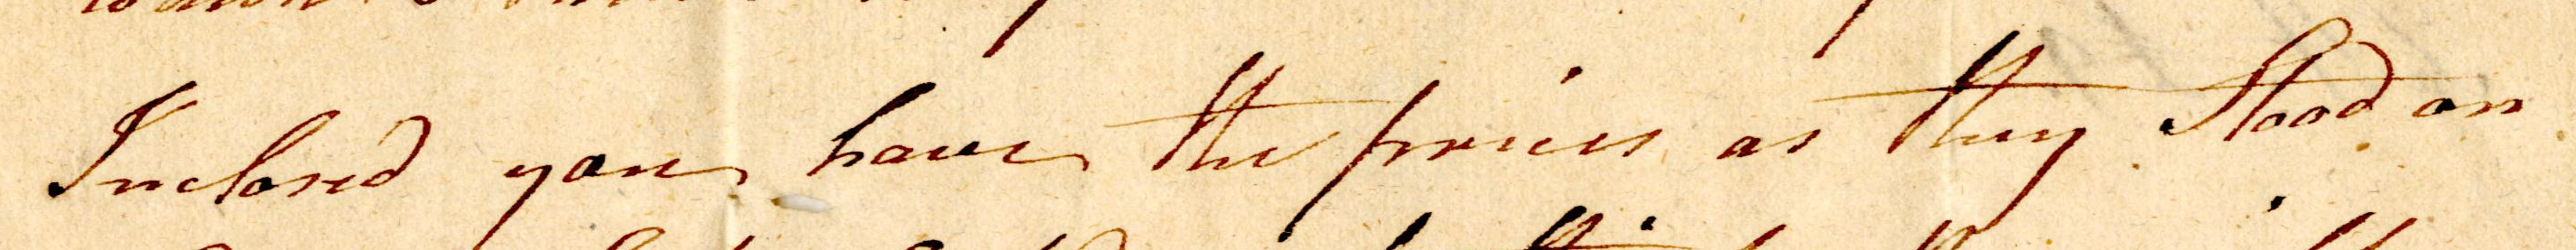Inclosed you have the prices as they Stood on
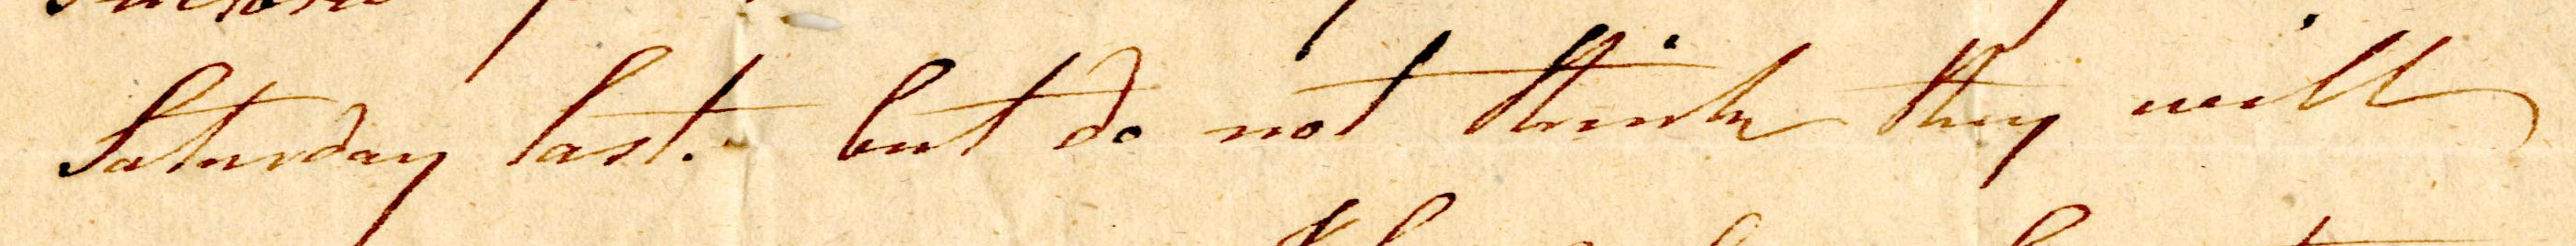Saturday last but do not think they will
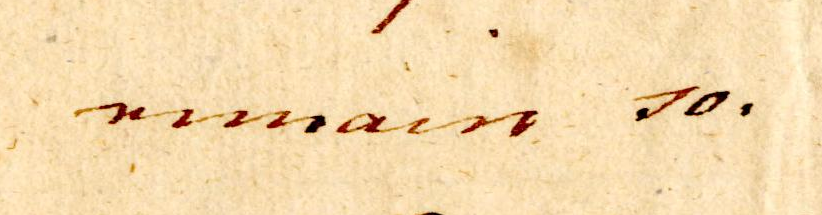remain so.
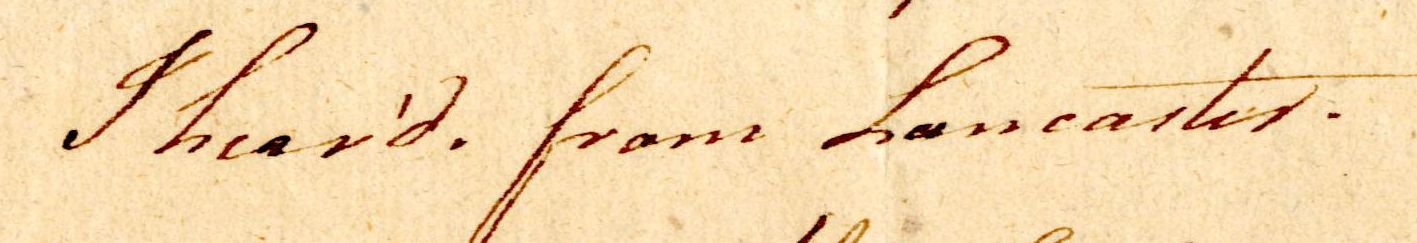I hear'd from Lancaster.
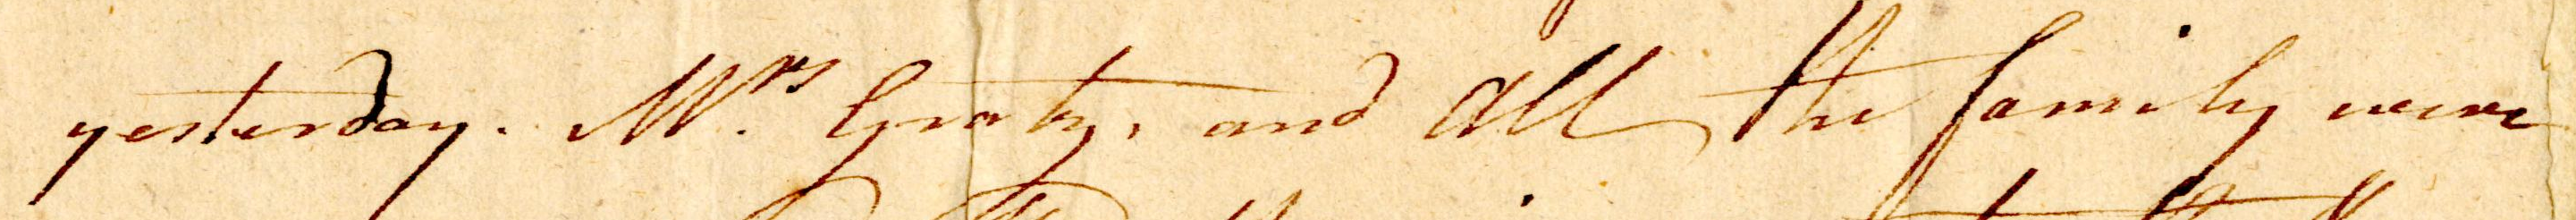yesterday. M^rs. Gratz. and All the family were
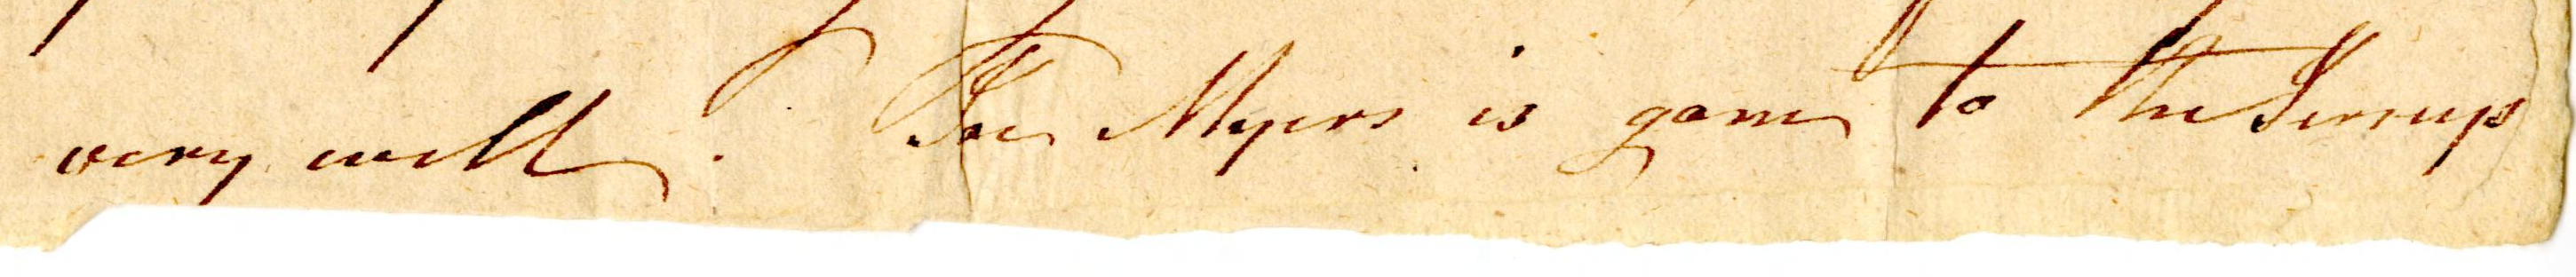very well. Jac Myers is gone to the Surys
